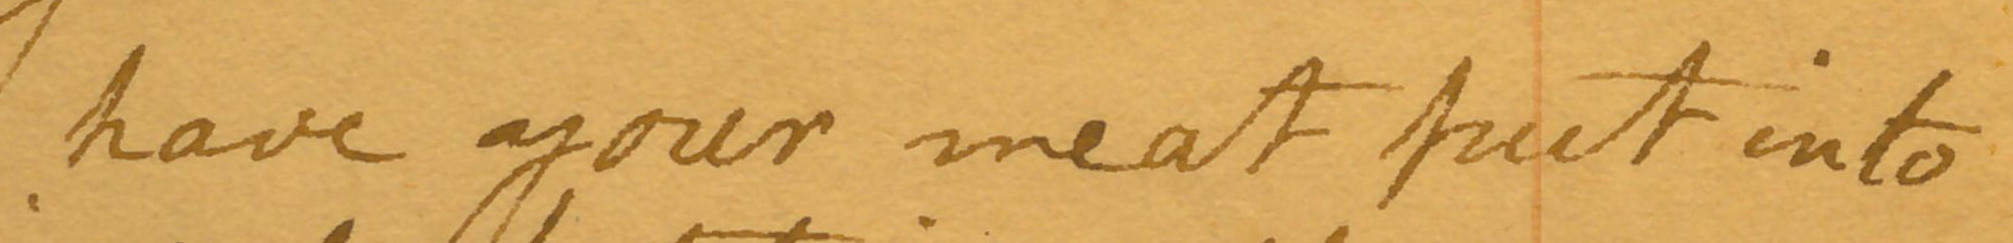have your meat put into
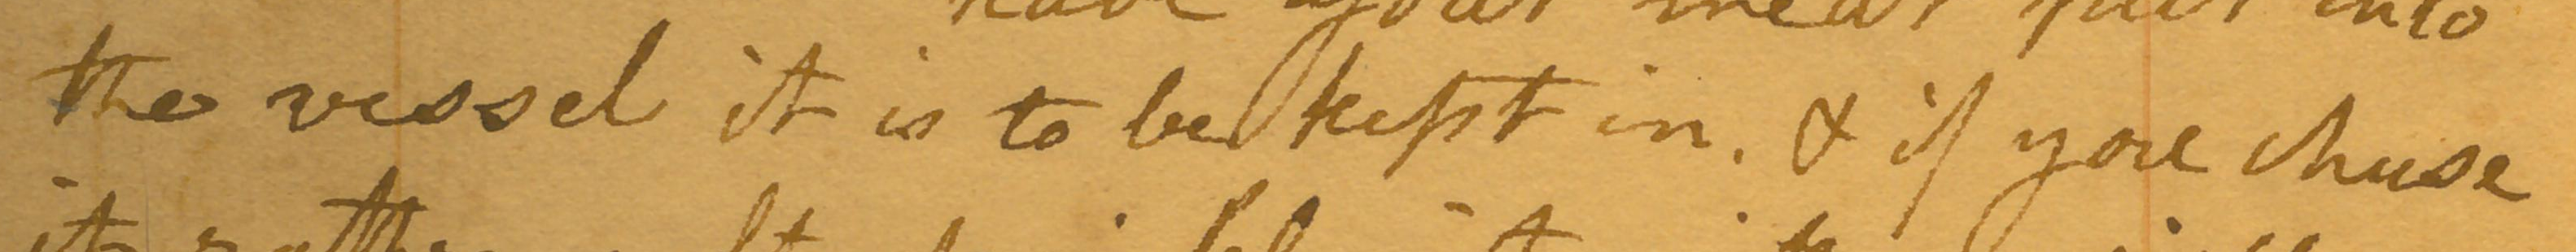the vessel it is to be kept in. & if you chuse
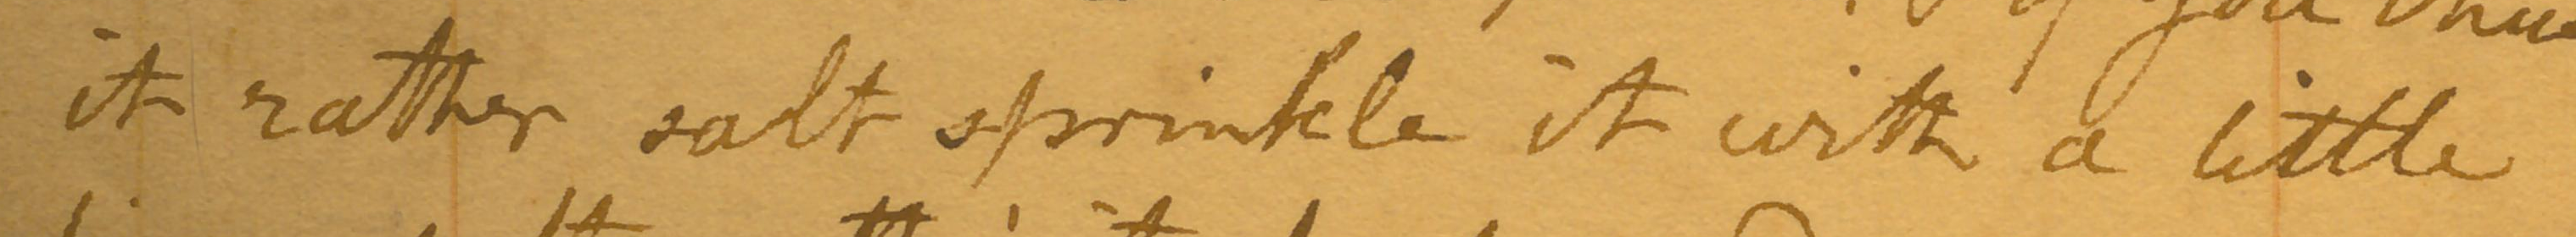it rather salt sprinkle it with a little
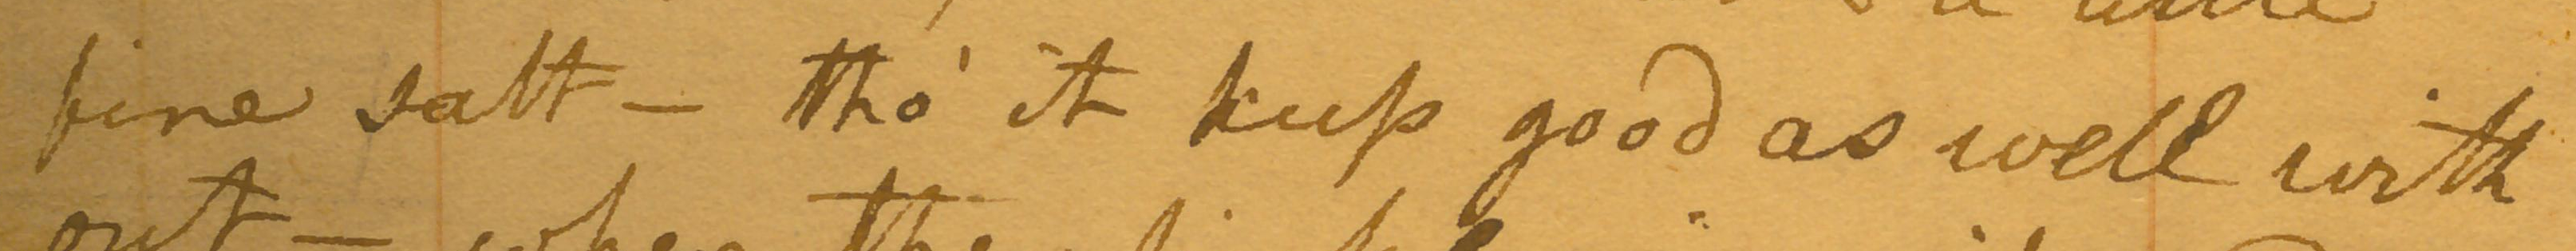fine salt- tho' it keep good as well with
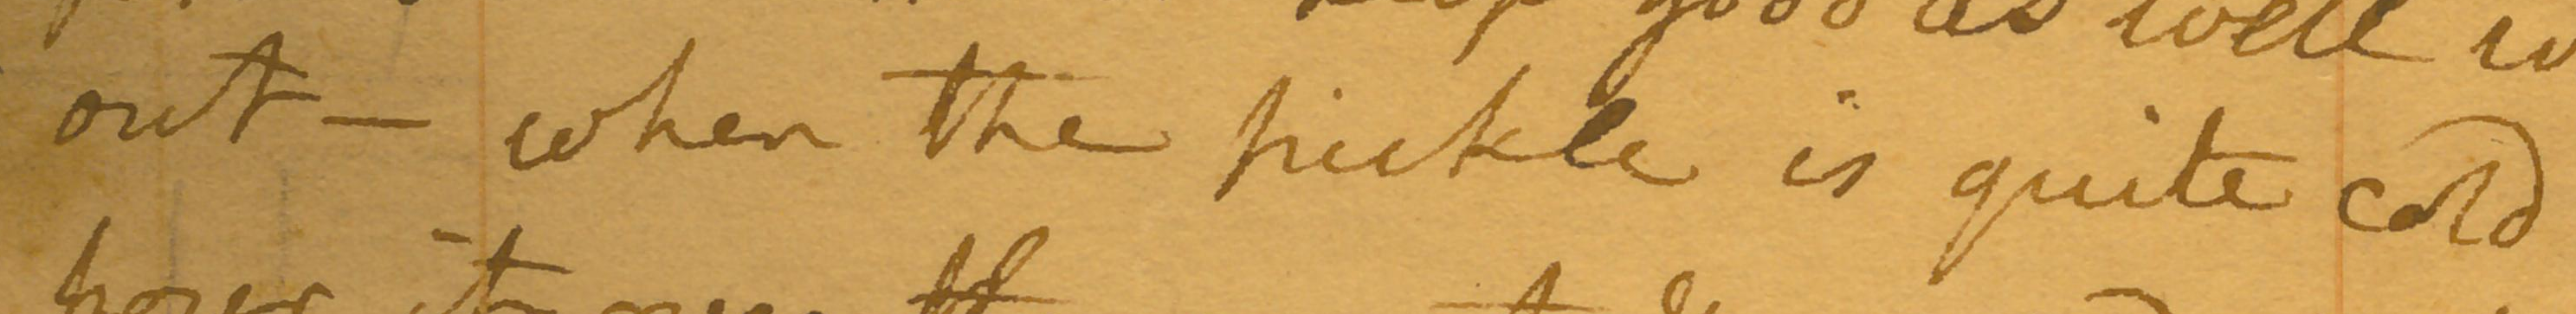out- when the pickle is quite cold
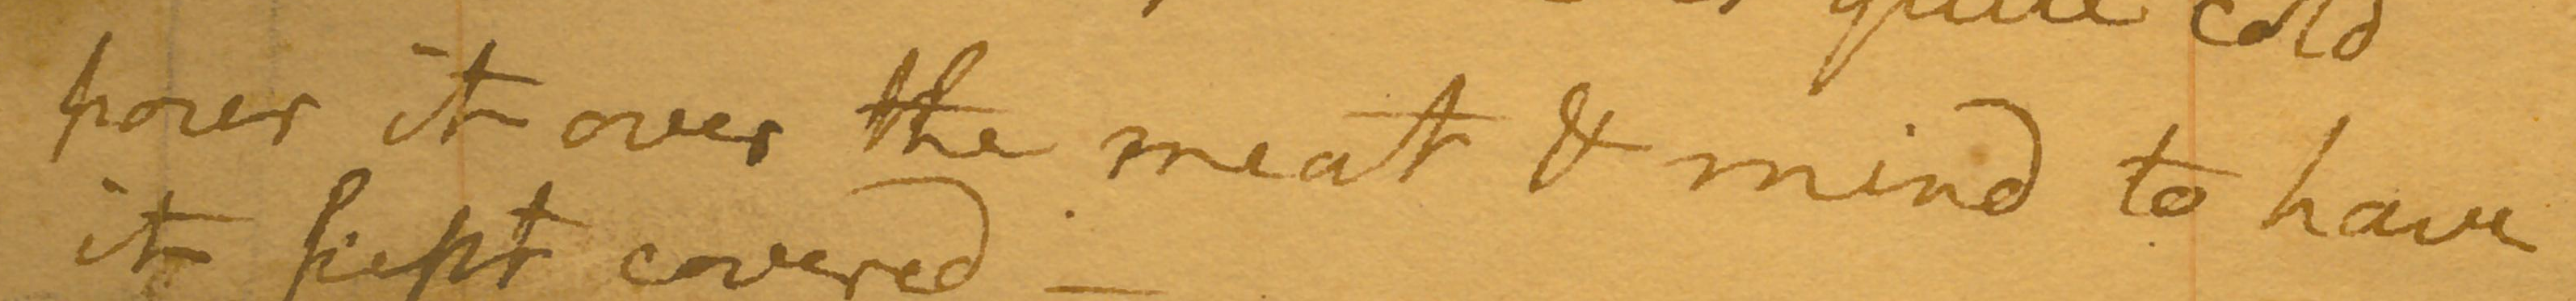pour it over the meat & mind to have
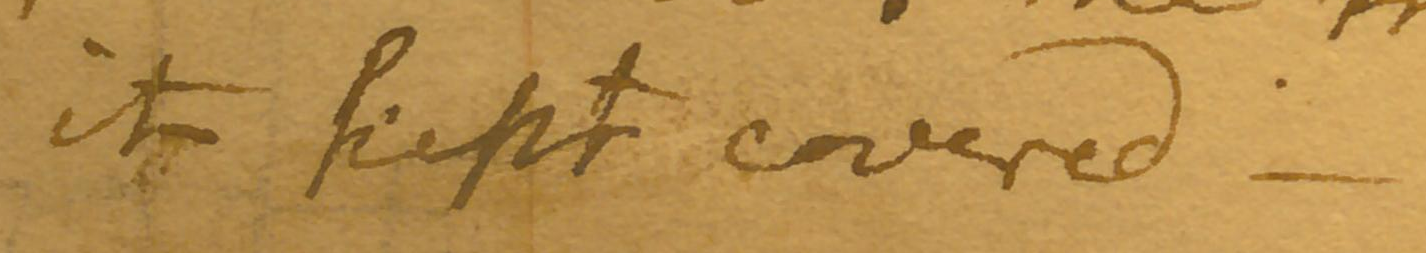it kept covered-
